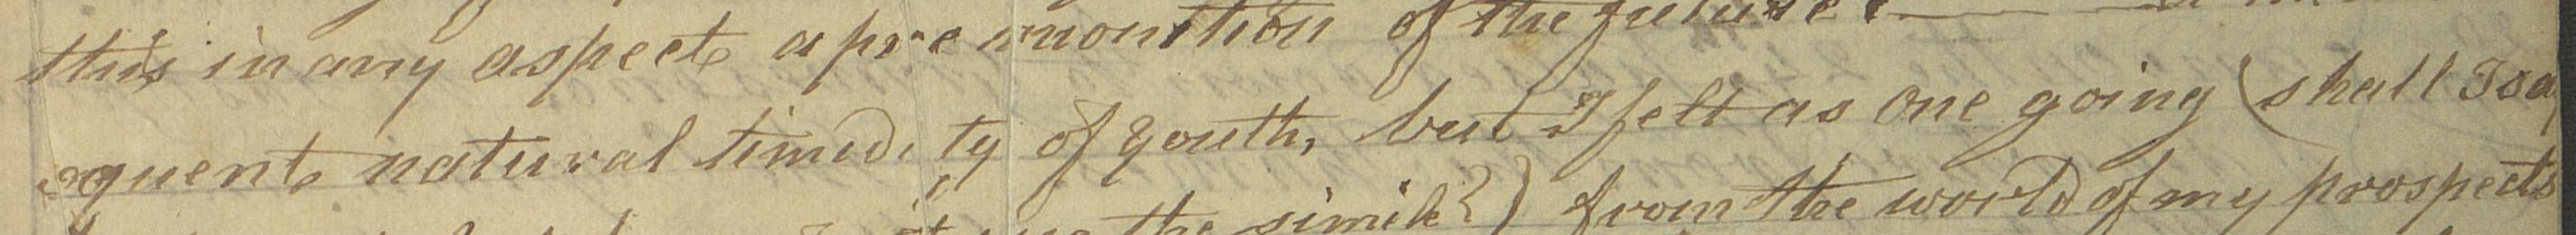-quent natural timidity of youth, but I felt as one going (shall I say
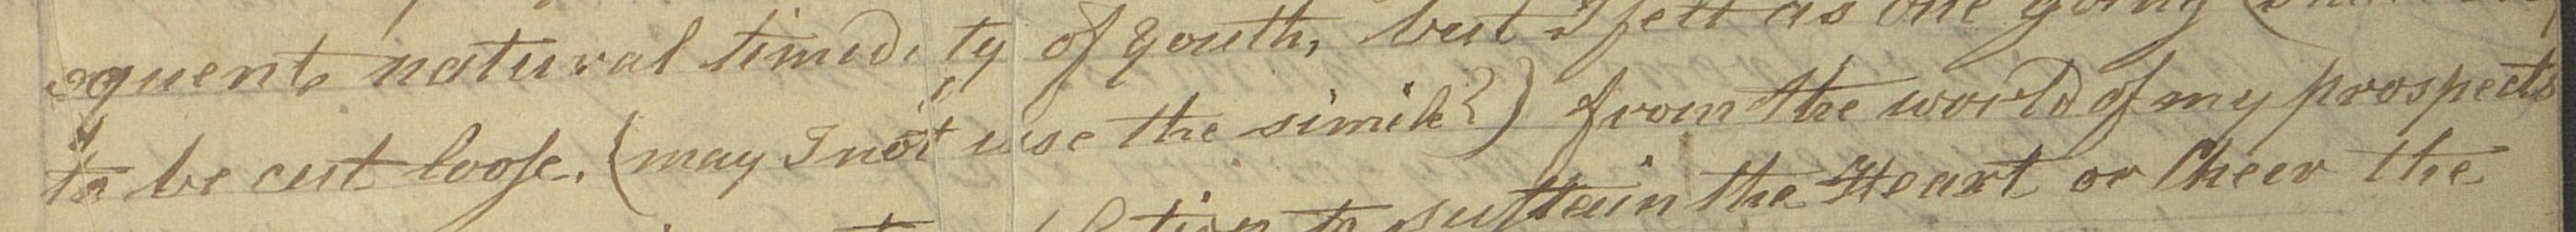to be cut loose. (may I not use the simile?) from the world of my prospects
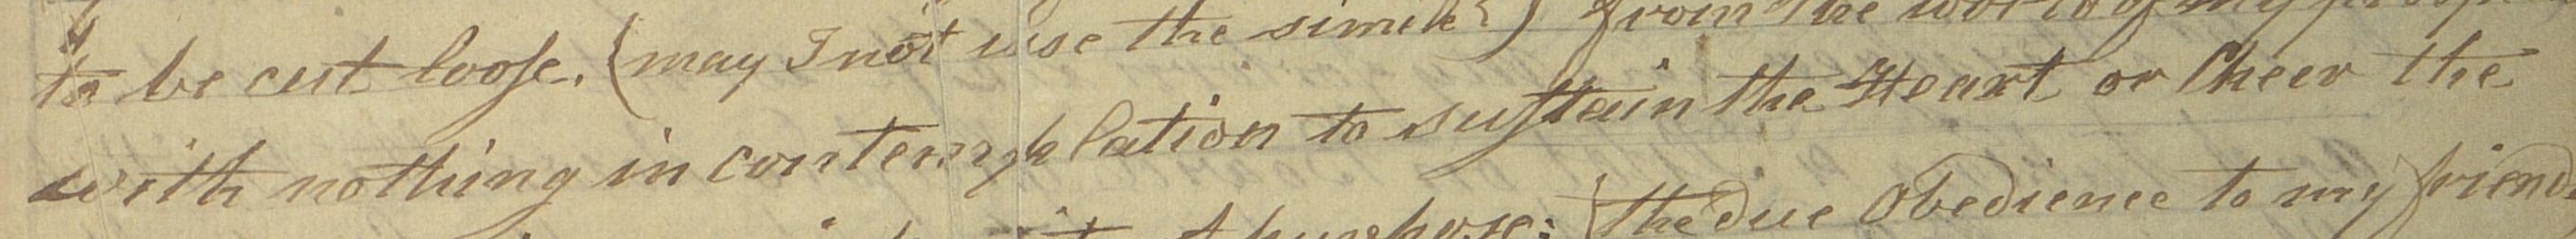with nothing in contemplation to sustain the Heart or Cheer the
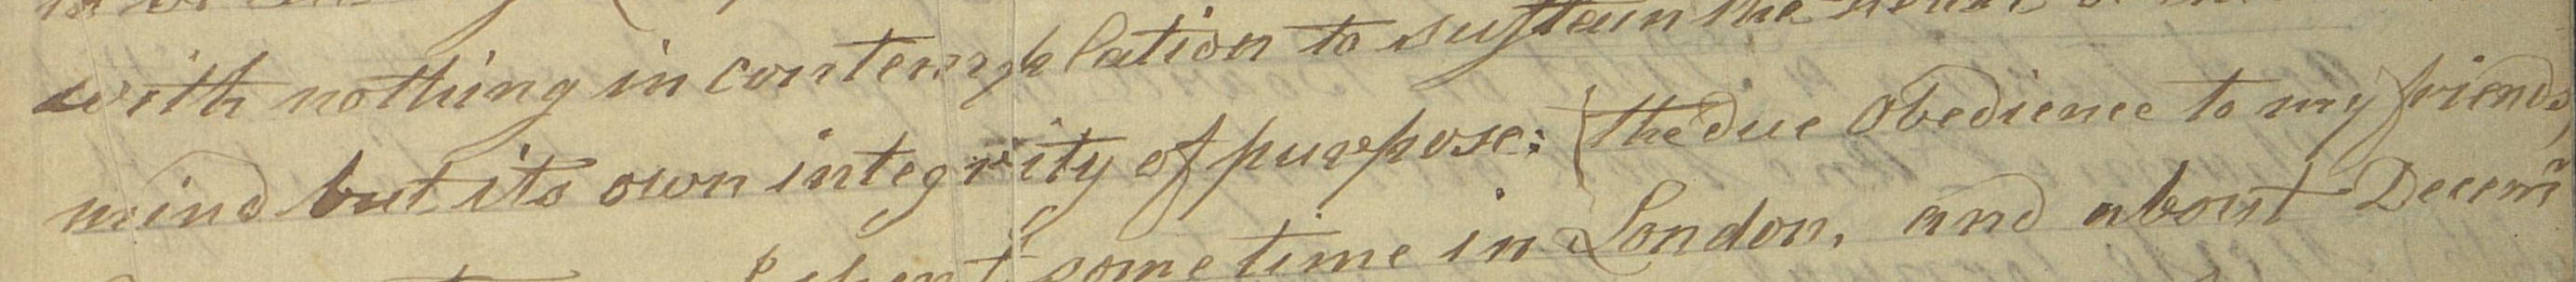mind but its own integrity of purpose; (the due Obedience to my friends,
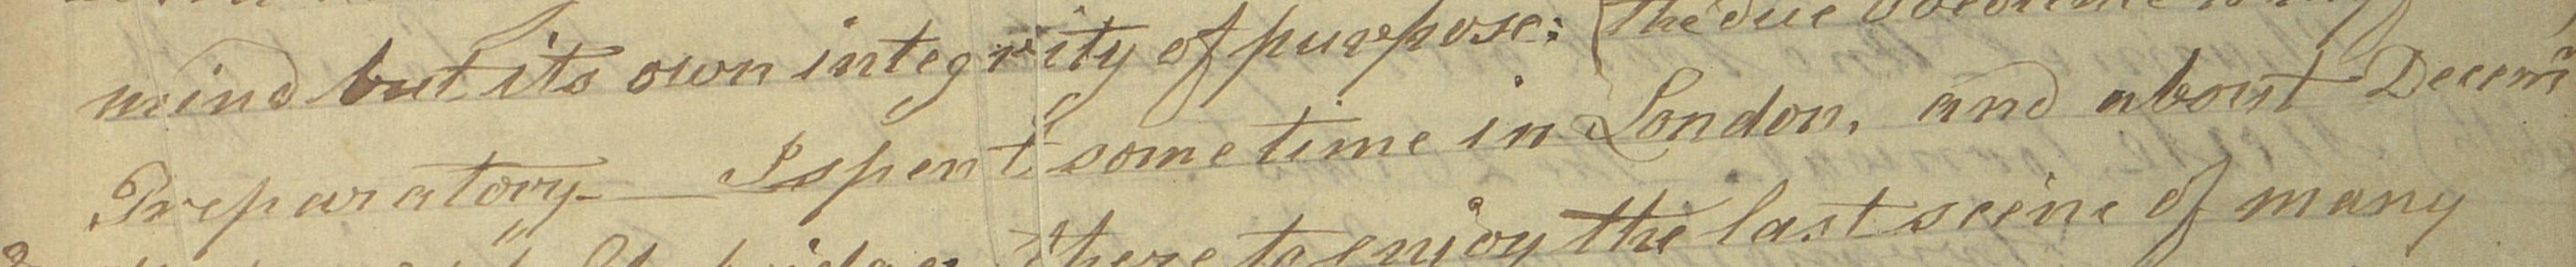Preparatory. I spent sometime in London, and about Decem^r
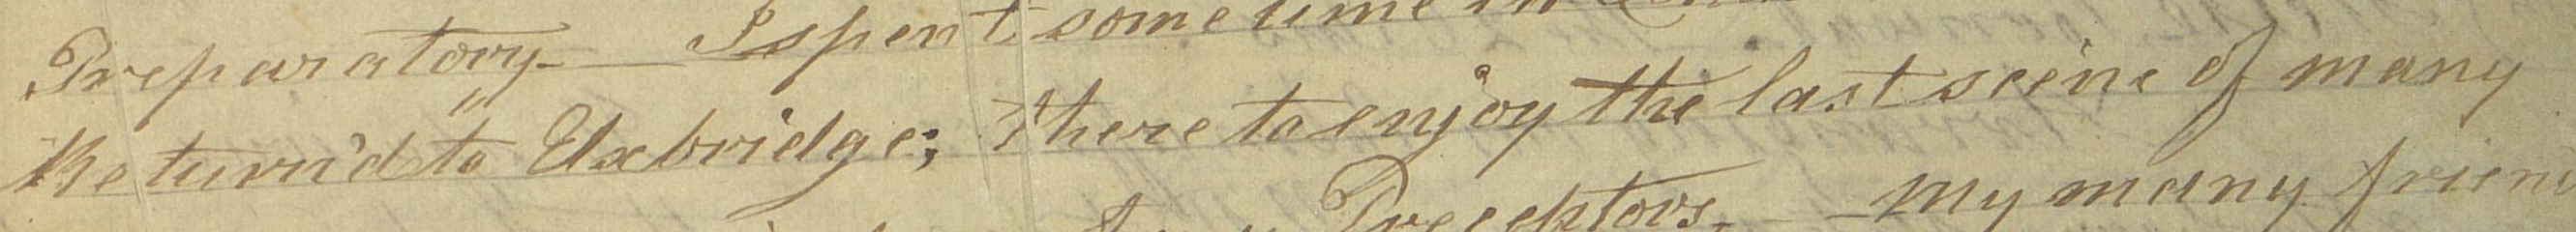Return'd to Uxbridge; there to enjoy the last scene of many
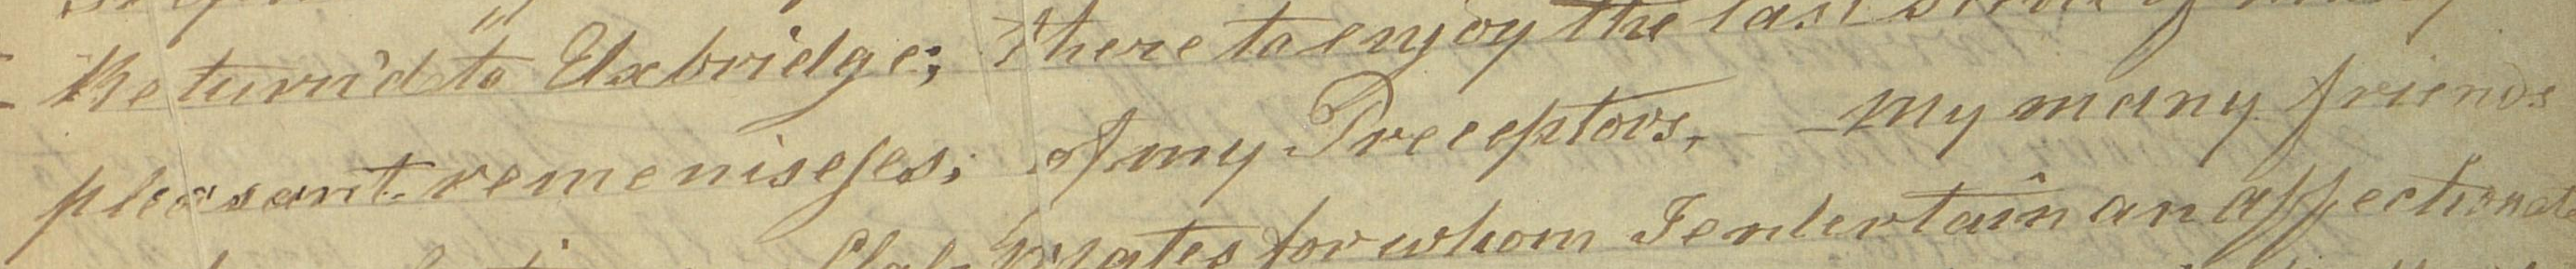pleasant remenisesses, of my Preceptors. My many friends
